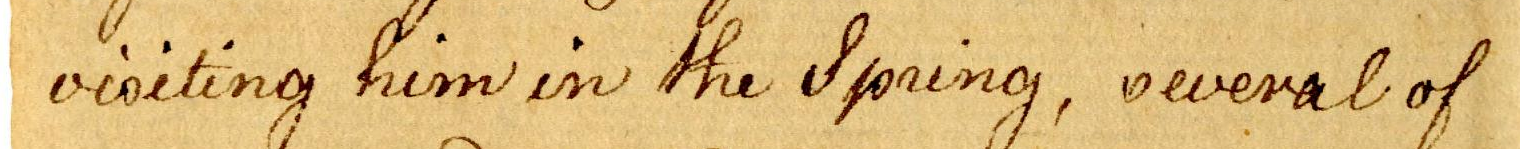visiting him in the Spring, several of
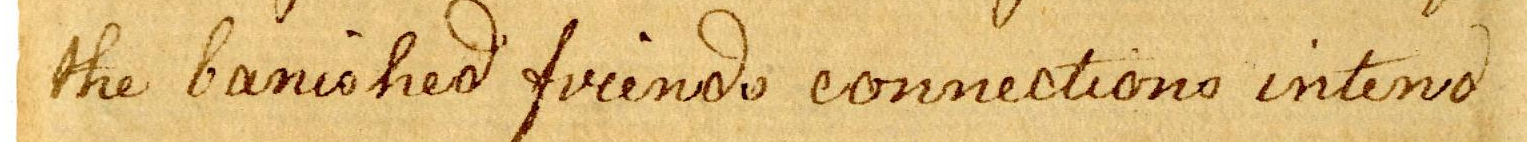the banished friends connections intend
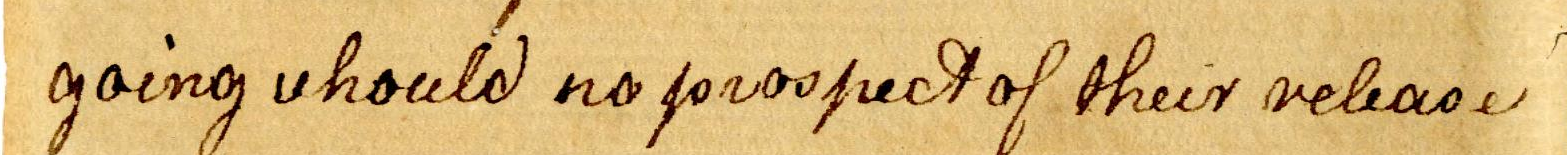going should no prospect of their release
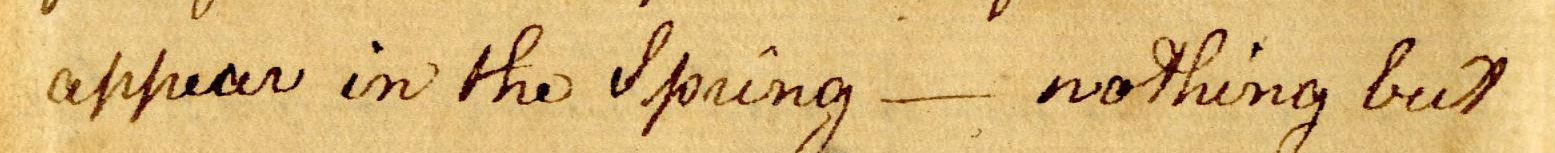appear in the Spring- nothing but
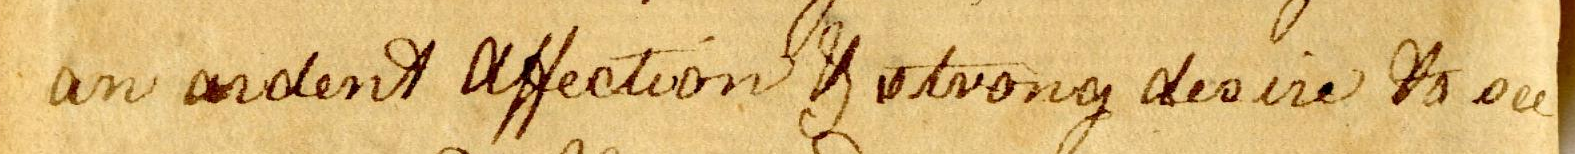an ardent Affection & strong desire to see
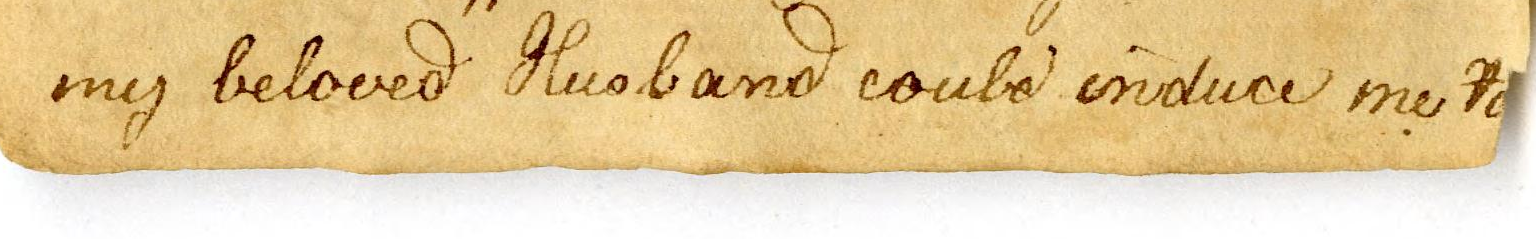my beloved Husband could induce me to
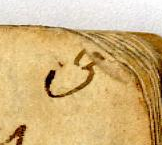3
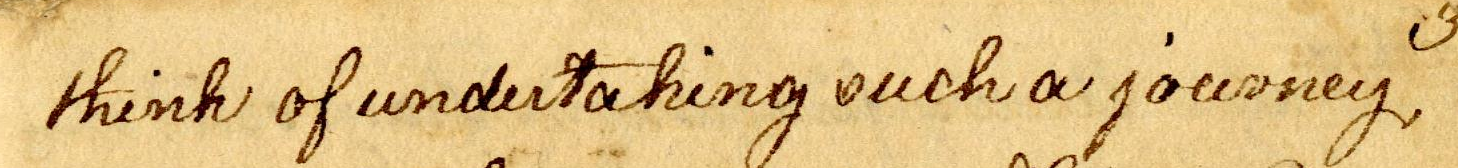think of undertaking such a journey
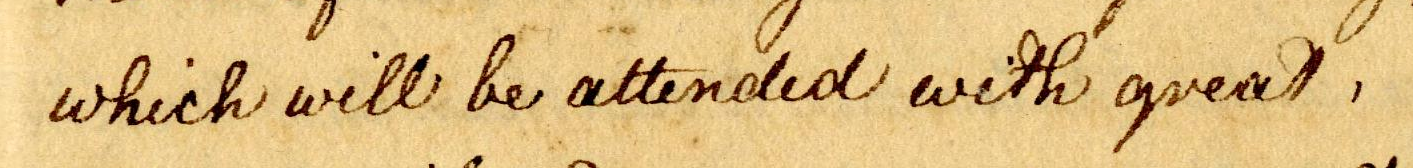which will be attended with great,
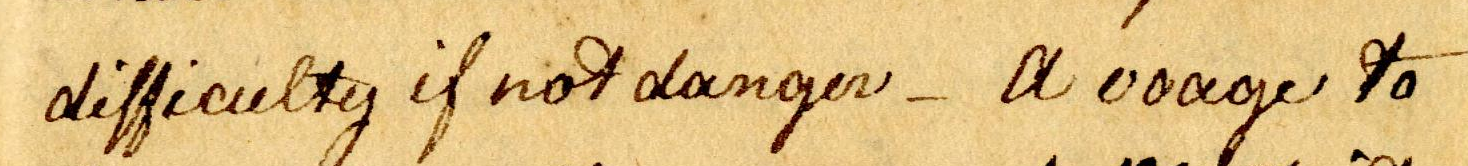difficulty if not danger- A voage to
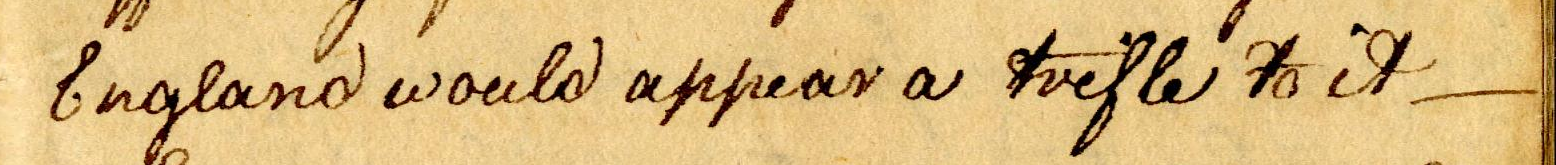England would appear a trifle to it-
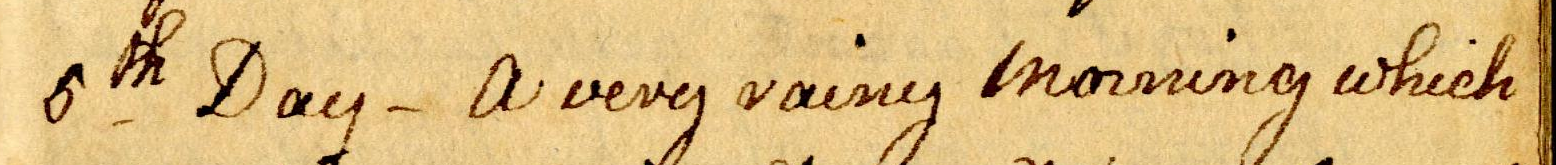5^th Day- A very rainy Morning which
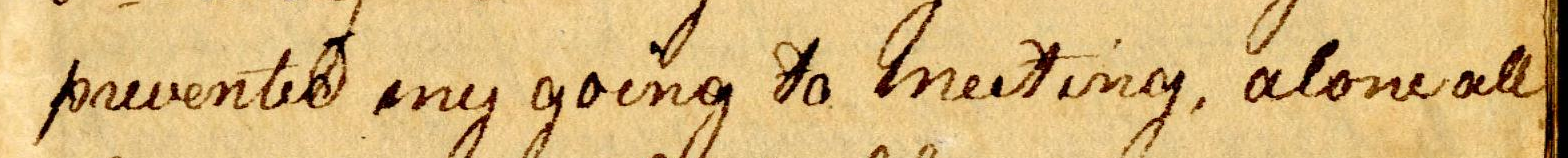prevented my going to Meeting, alone all
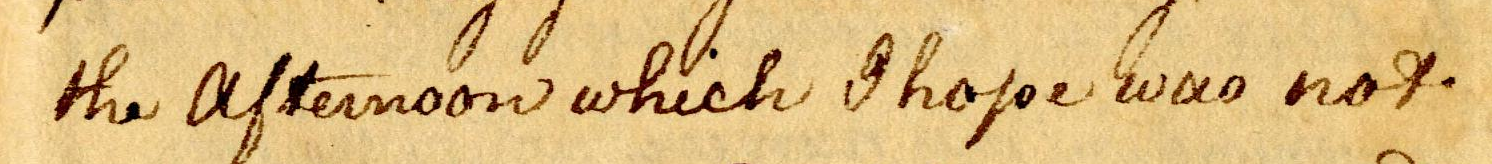the Afternoon which I hope was not
